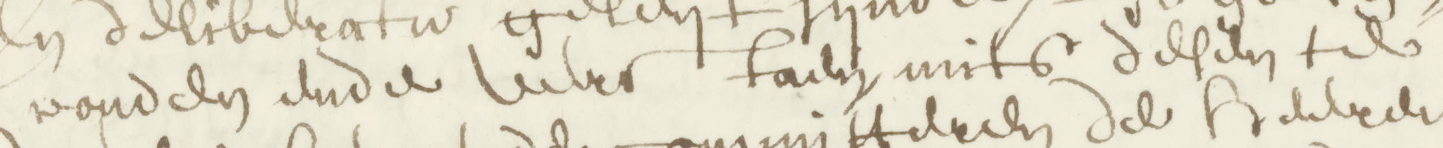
vonden ende verstaen, mits desen te
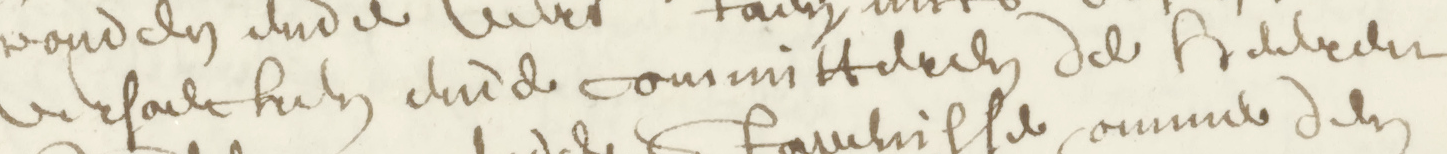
versoecken ende committeren de Heeren
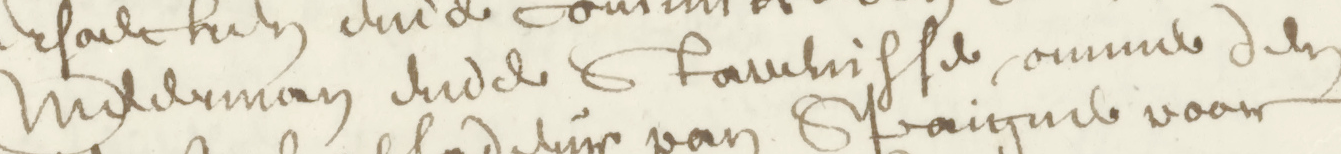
Meerman ende Stavenisse, omme der
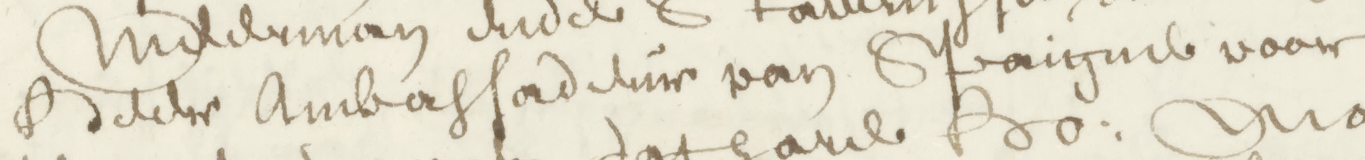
Heer Ambassadeur van Spaigne voor
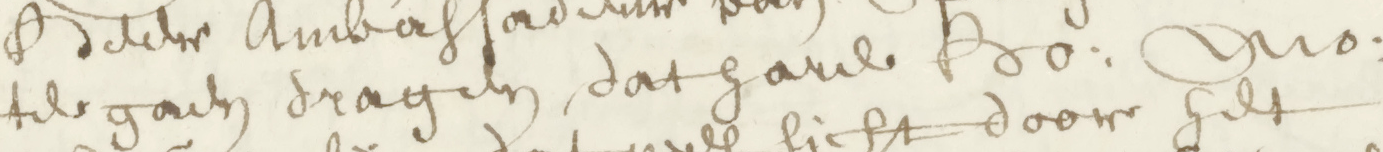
te gaen dragen, dat hare Ho:Mo:
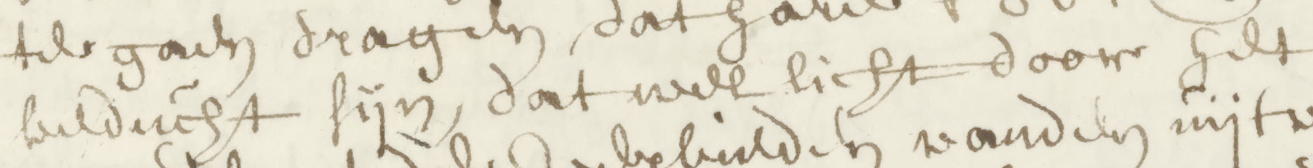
beducht sijn, dat wellicht door het
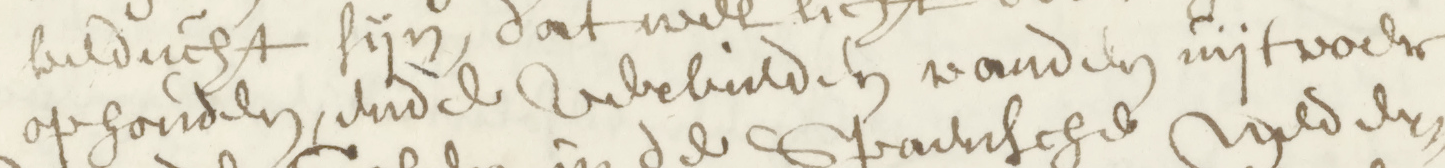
ophouden, ende verbieden vanden uijtvoer
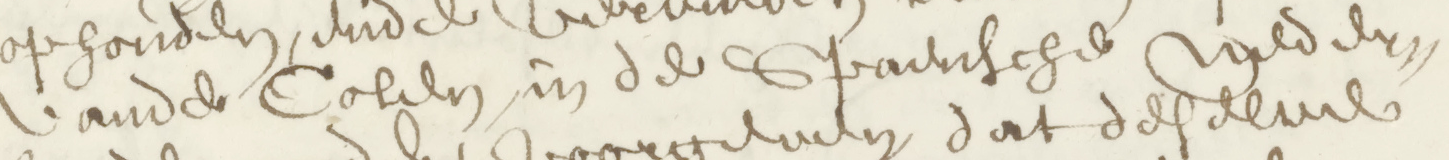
vande Colen, in de Spaensche Neder„
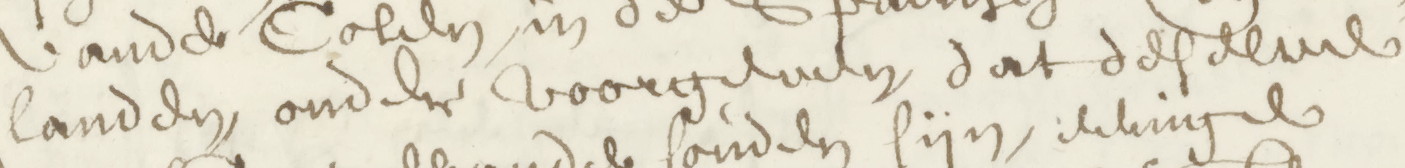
landen, onder voorgeven, dat deselve
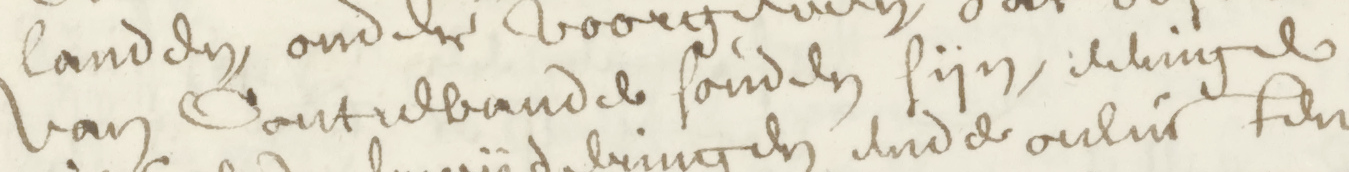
van Contrebande souden sijn, eenige
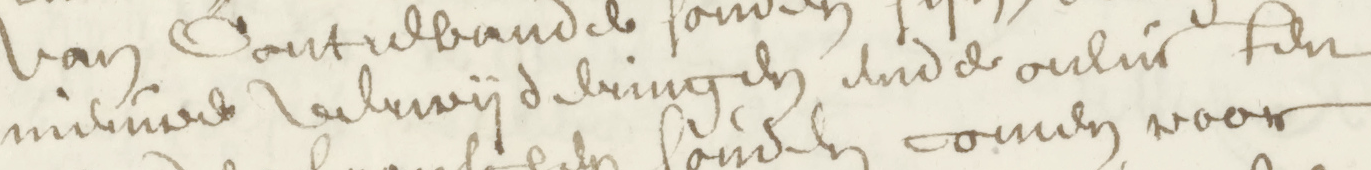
nieuwe verwijderingen ende onlusten
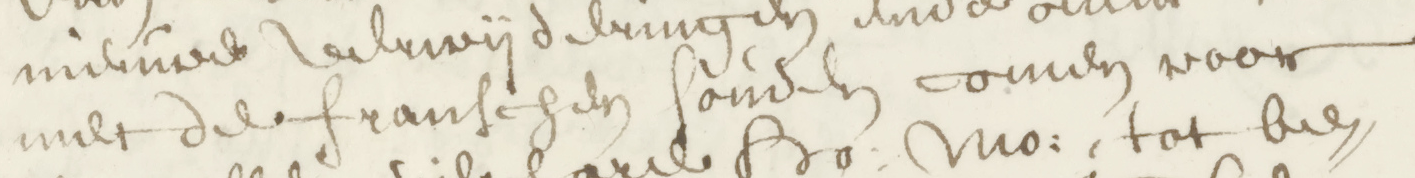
met de franschen souden comen voor
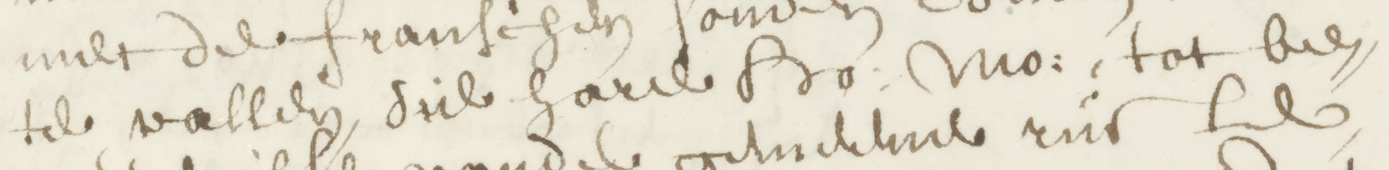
te vallen, die hare Ho:Mo:, tot be„
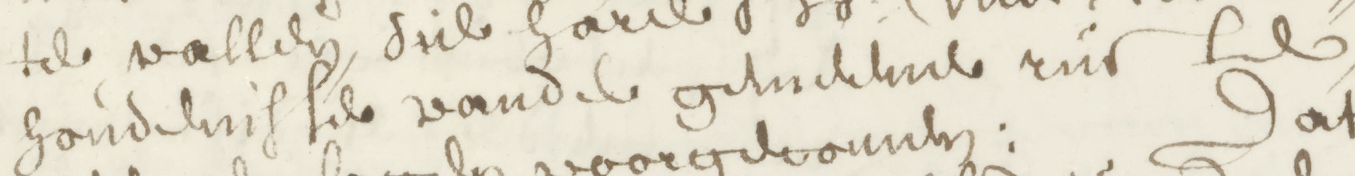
houdenisse vande gemeene ruste
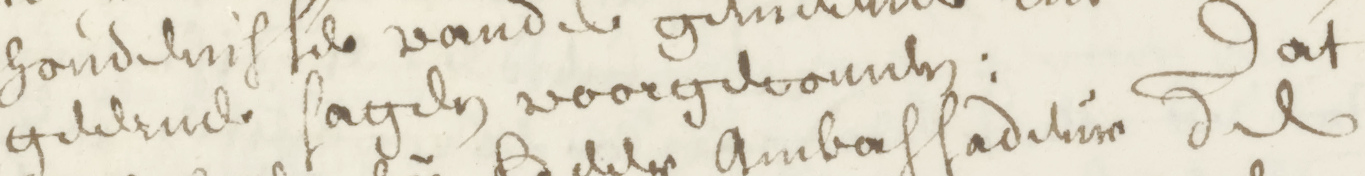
geerne sagen voorgecomen: Dat
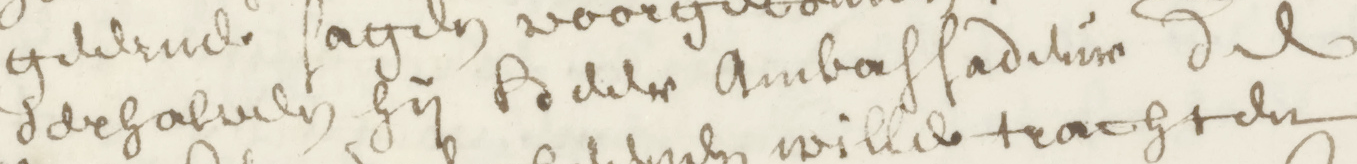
derhalven hij Heer Ambassadeur de
